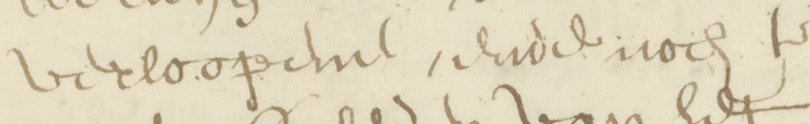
verloopene, ende noch t
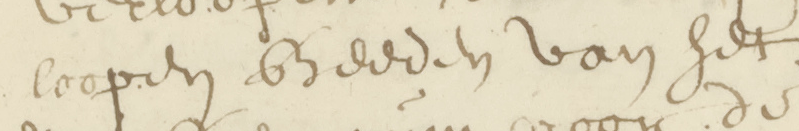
loopen Beeden van het
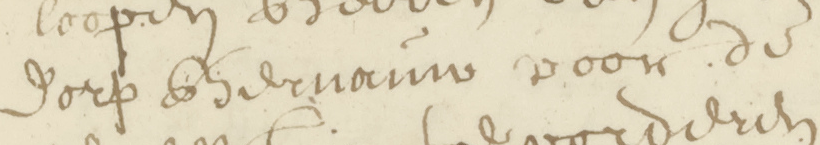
dorp Bernauw voor de
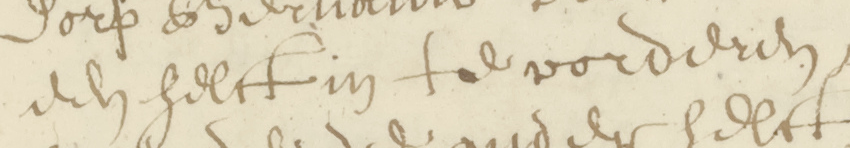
een helft in te vorderen
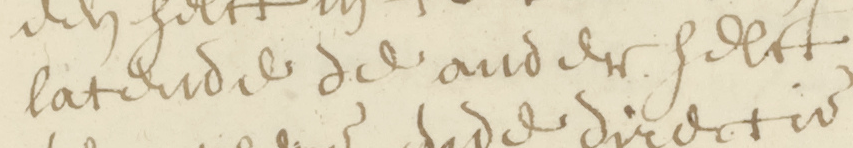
latende de ander helft
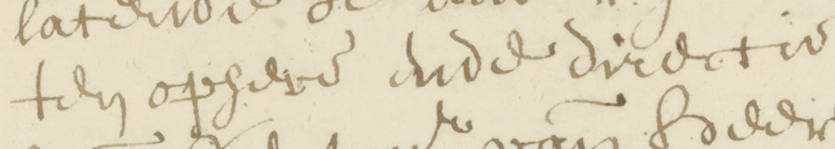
ten opheve ende directie
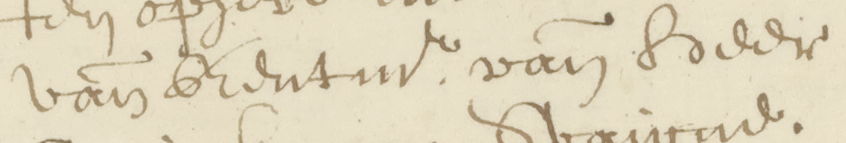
van Rentmr. van Heer
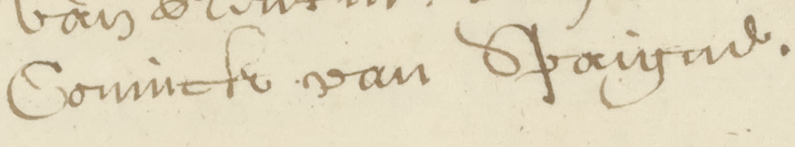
Coninck van Spaigne.
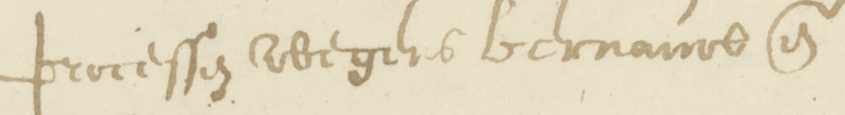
Processen wegens Bernauw &
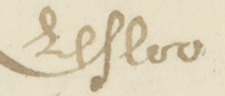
Elsloo.
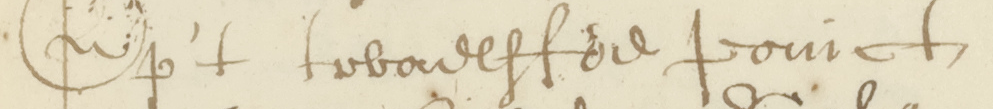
Op 't twaelffde poinct,
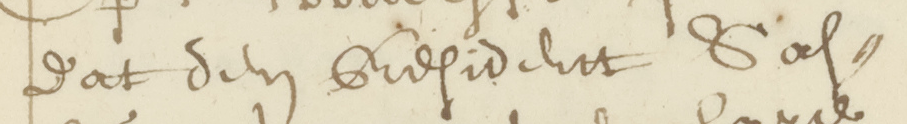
dat den Resident Sas,,
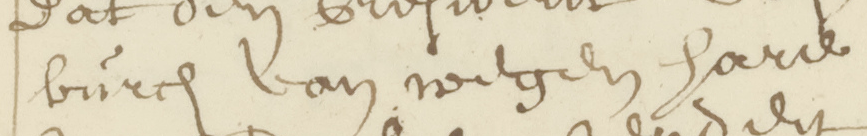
burch van wegen hare
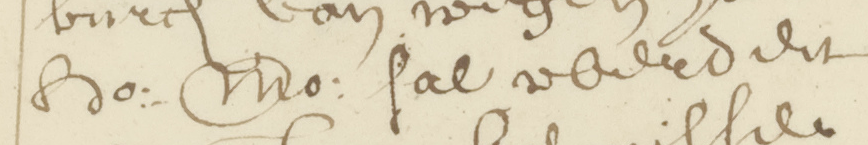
Ho:Mo: sal werden
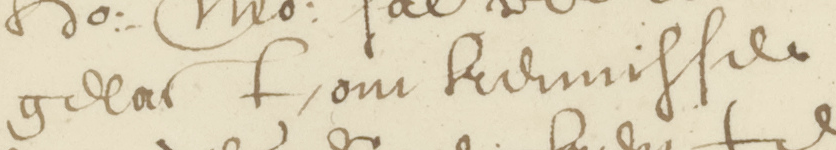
gelast, om kennisse
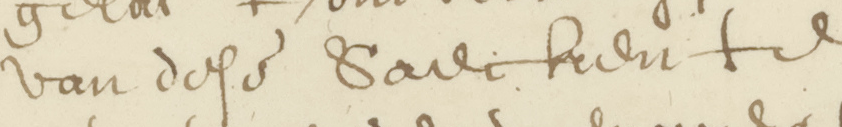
van dese Saecken te
